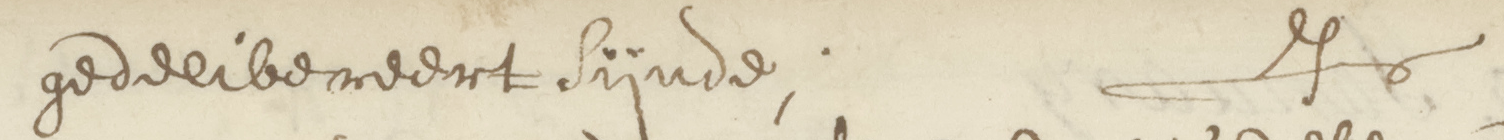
gedelibereert sijnde: Is
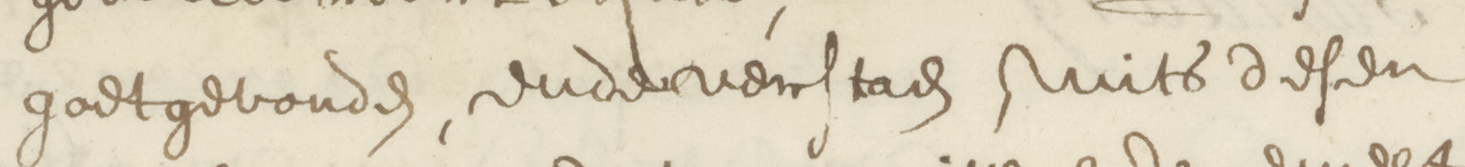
goetgevonden ende verstaen mits desen
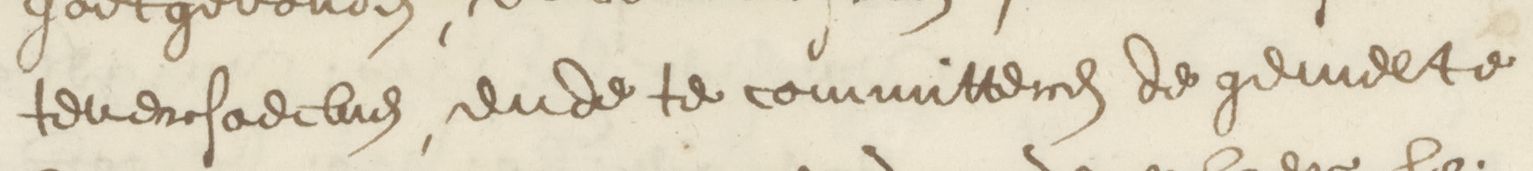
te versoecken ende te committeren de gemelte
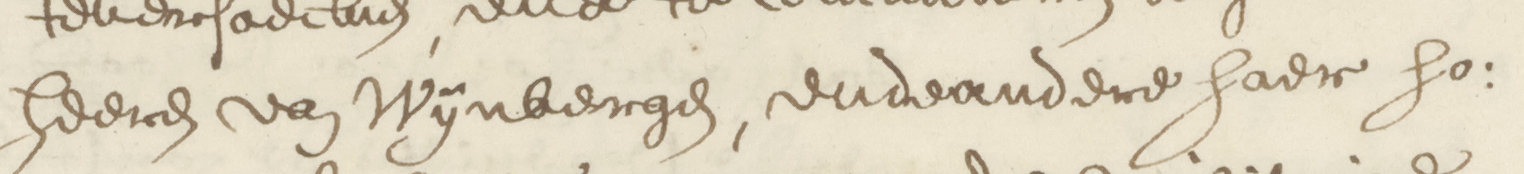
heeren van Wijnbergen, ende andere haer Ho:
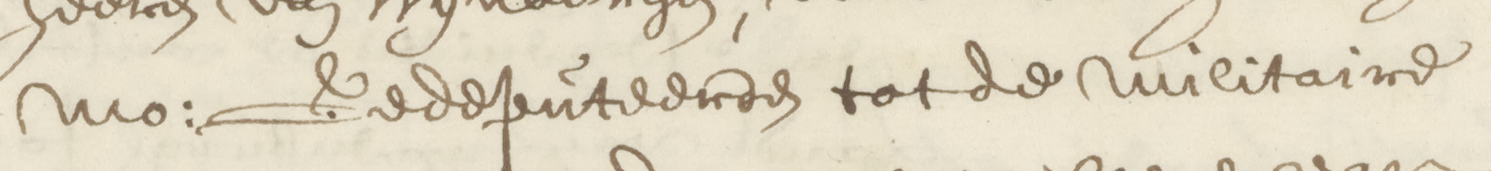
Mo: Gedeputeerden tot de militaire
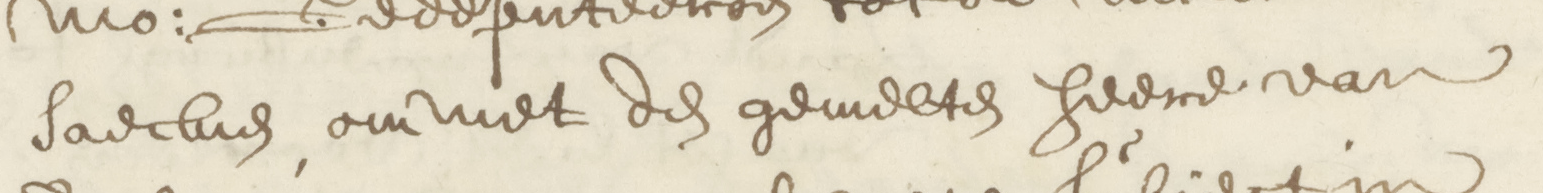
saecken om met den gemelten heere van
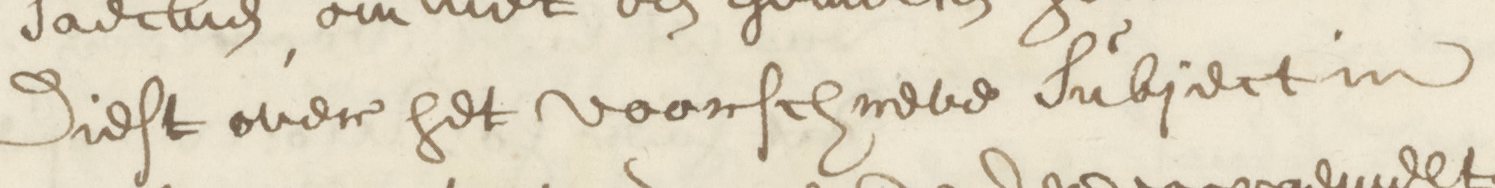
Diest over het voorschreve subject in
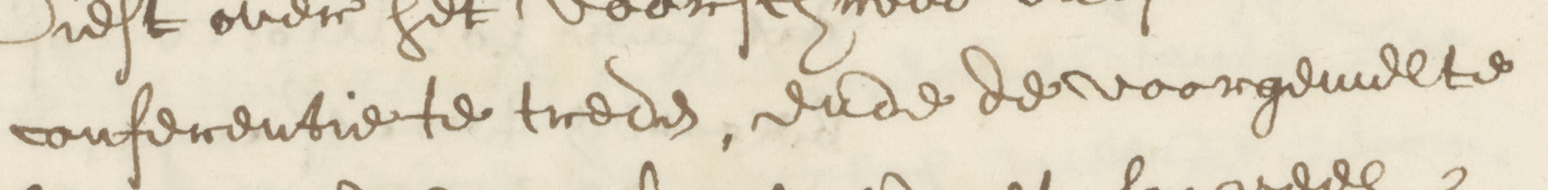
conferentie te treden, ende de voorgemelte
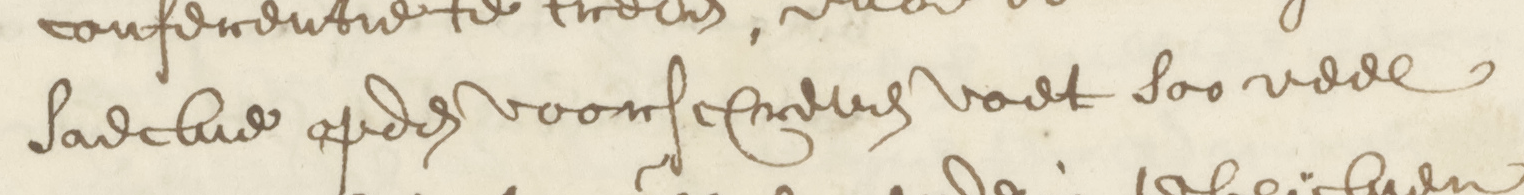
saecke opden voorschreven voet soo veel
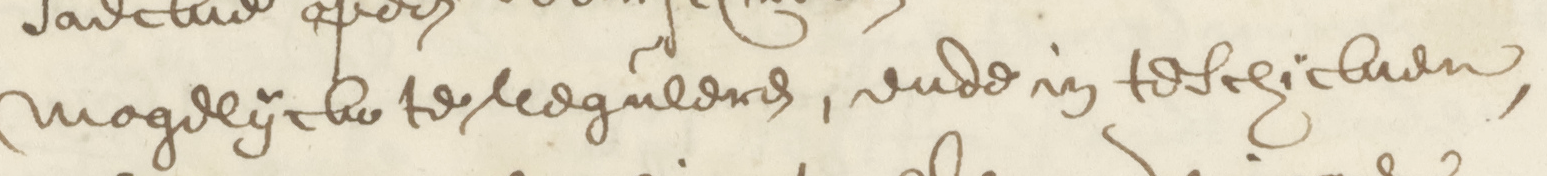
mogelijck te reguleren, ende in te schicken,
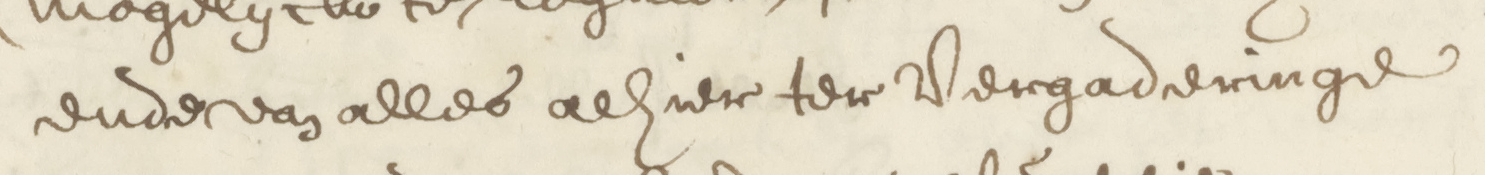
ende van alles alhier ter Vergaderinge
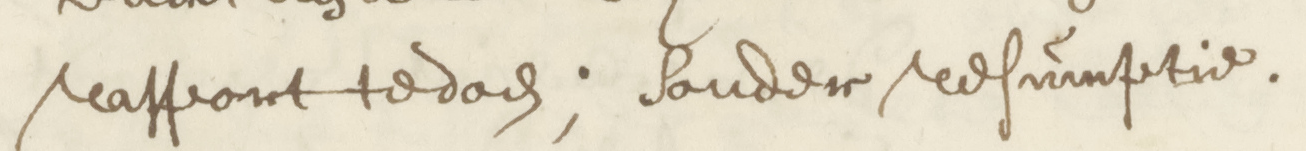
rapport te doen; sonder resumptie.
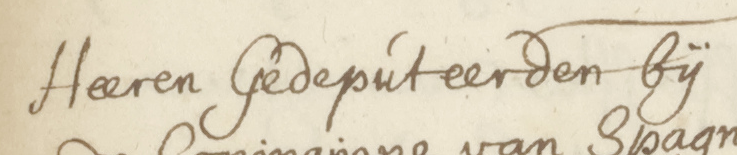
Heeren Gedeputeerden bij
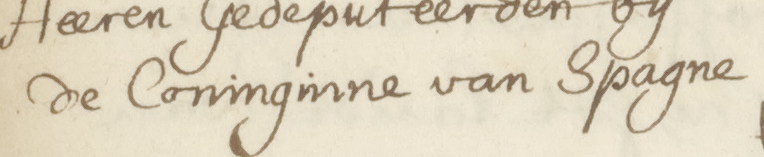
de Coninginne van Spagne
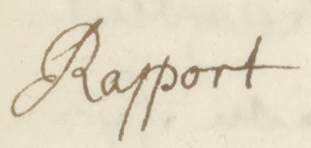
Rapport
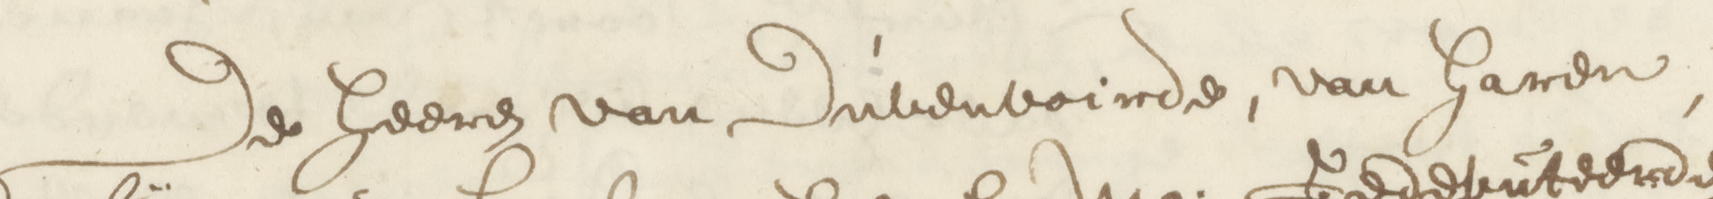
De heeren van Duvenvoirde, van Haren
